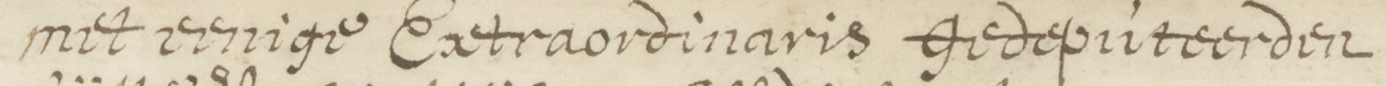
met eenige Extraordinaris Gedeputeerden
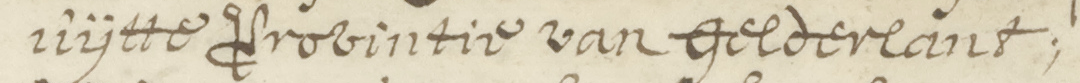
uijtte Provintie van Gelderlant;
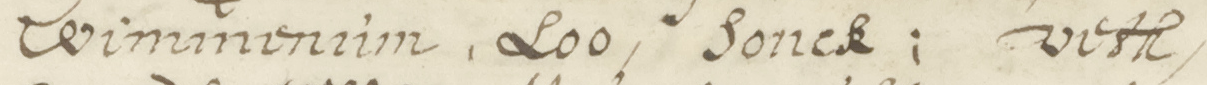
Wimmenum, Loo, Sonck; Veth,
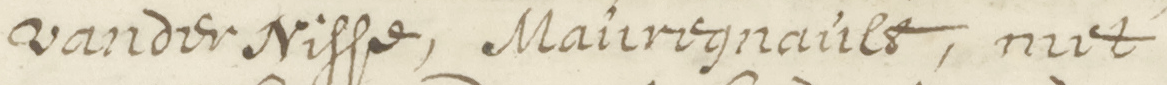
van der Nisse, Mauregnault, met
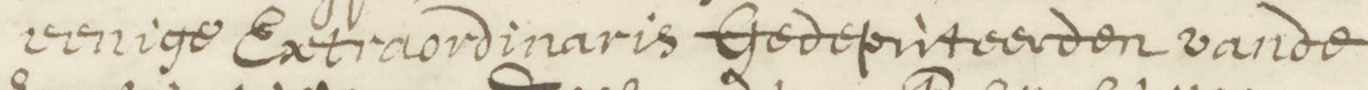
eenige Extraordinaris Gedeputeerden vande
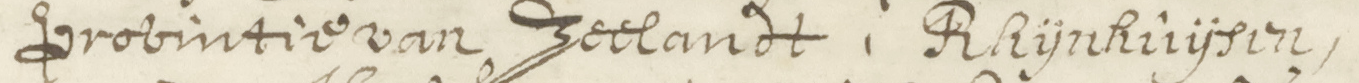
Provintie van Zeelandt, Rhijnhuijsen,
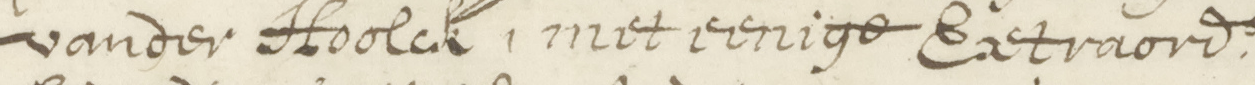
vander Hoolck, met eenige Extraords.
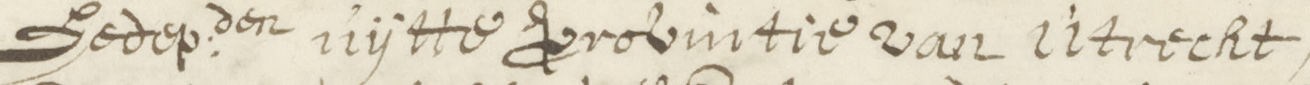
Gedepden: uijtte Provintie van Utrecht,
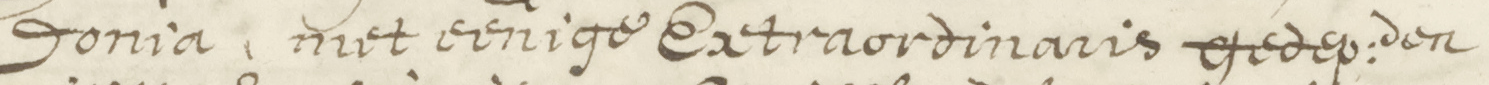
Donia, met eenige Extraordinaris gedepden:
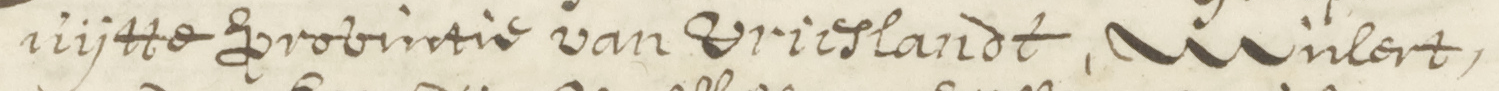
uijtte Provintie van Vrieslandt, Mulert,
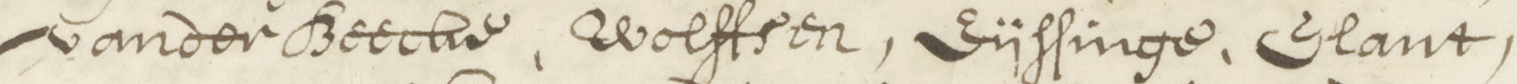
vander Beecke, Wolffsen, Eijssinge, Clant,
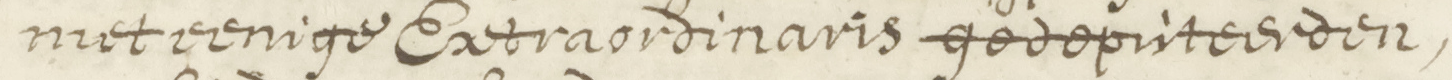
met eenige Extraordinaris gedeputeerden,
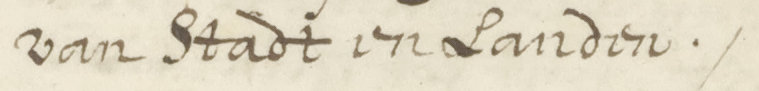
van Stadt en Landen.
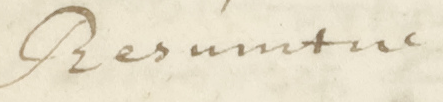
Resumtie
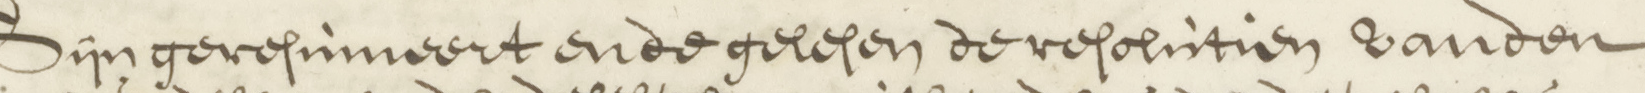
Sijn geresumeert ende gelesen de resolutien vanden
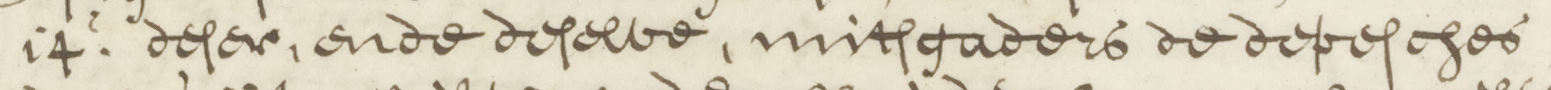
14e. deser, ende deselve, mitsgaders de depesches,
